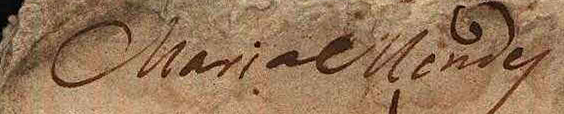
Maria Mendes
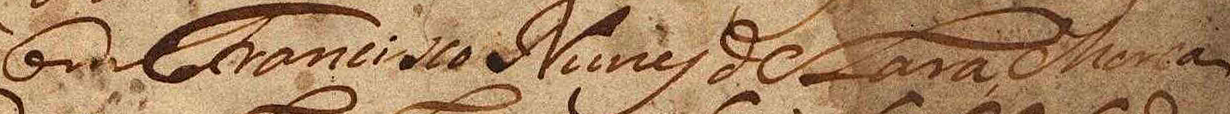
Com Francisco Nunes de Lara, Merca
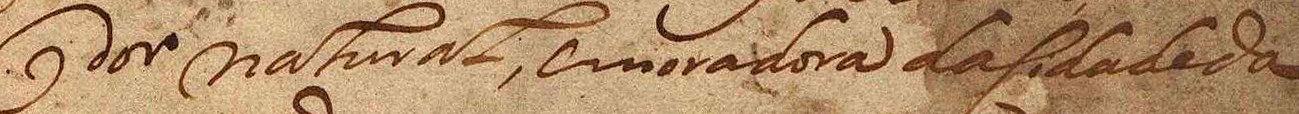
dor natural, e moradora da Cidade da
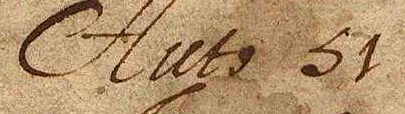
Auto 51
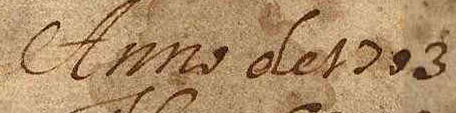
Anno de 1703
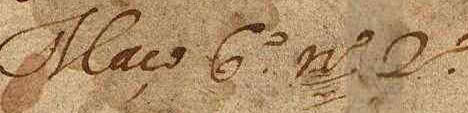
Maço 6.o n.o 2.o
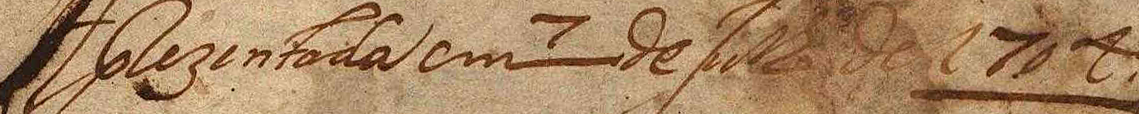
Aprezentada em 7 de Julho de 1704.
